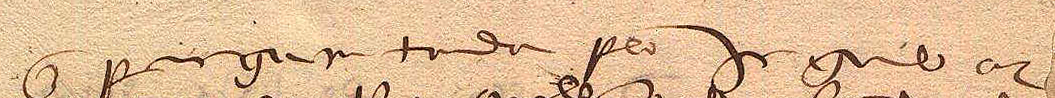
item pergumtada plō segundo ar
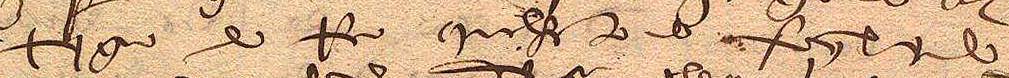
tyguo do Reo que lhe todo foy lydo
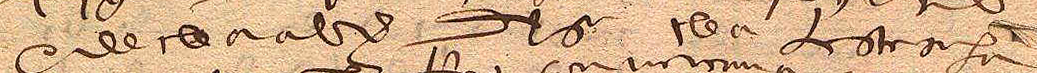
e decllarado . dyse ella testemunha
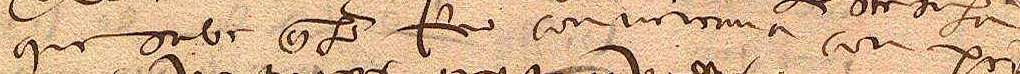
que sabe q̄ ho Reo conuercaua com pe
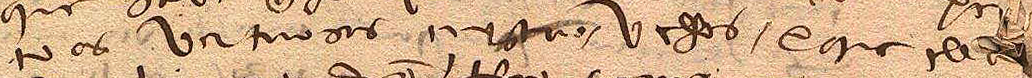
coas vertuosas crystaõs velhos / e que ella
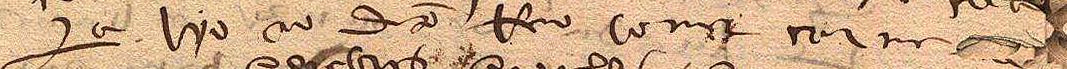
ta vyo ao dito Reo comer carne
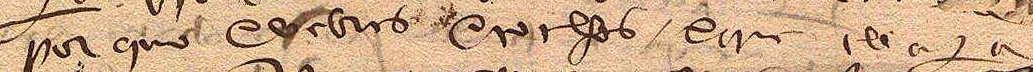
porquo e llebres e coelhos / E que ella ta
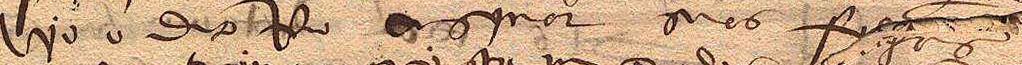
vyo o ditō Reo ensynar suas fi_has
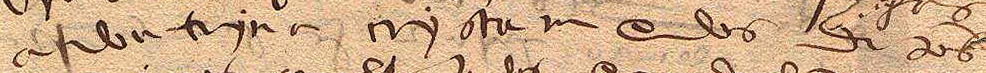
a doutryna crystam e dos ditos
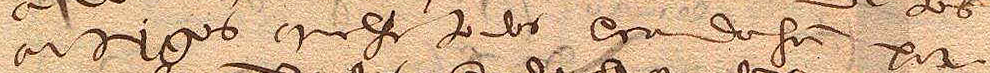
artygos que lhe todos e cada hū por
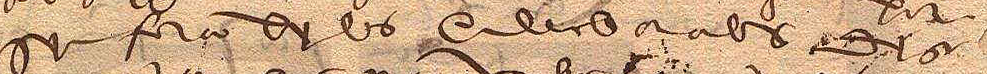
sy foraõ lydos e decllarados dyse
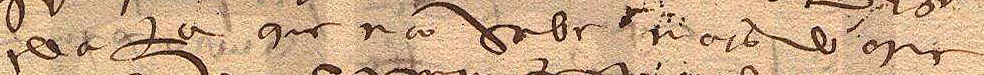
ella ta que naõ sabe mais do que
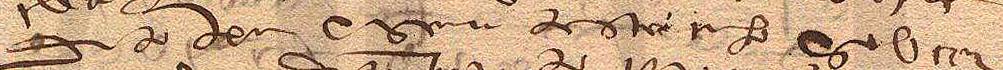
dito tem e seu testemho e sob car
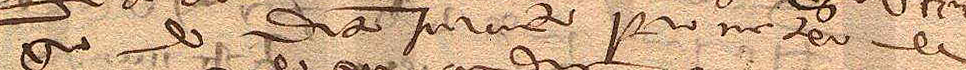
guo do ditō Juramto prometeo de
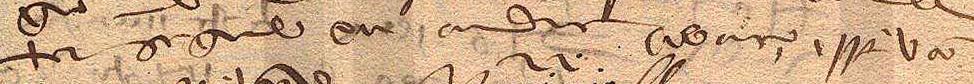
ter segredo eu andre colaço esp̄ivaõ
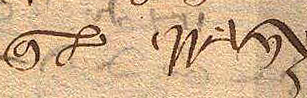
q̄ ho esp̄ivy
